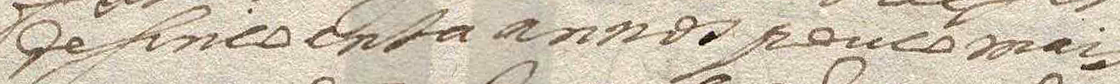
de sincoenta annos pouco mais
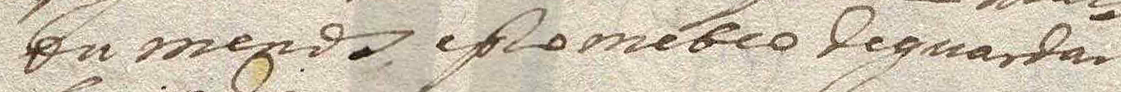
ou menos, e prometeo de guardar
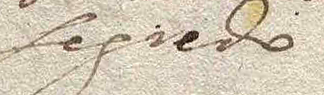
segredo
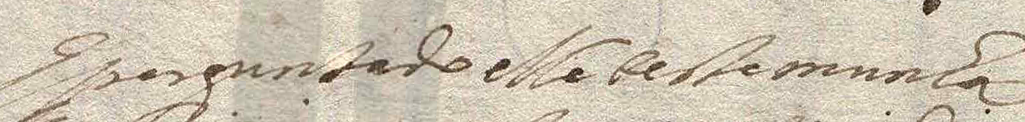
E perguntado elle testemunha
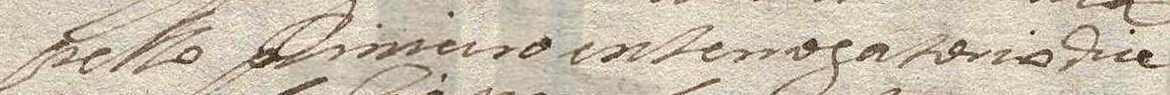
pello primeiro interrogatorio dice
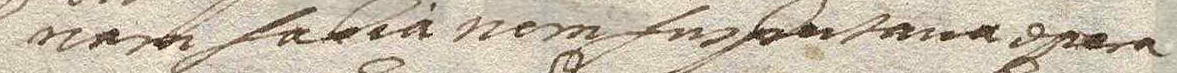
nam sabia nem suspeitaua o para
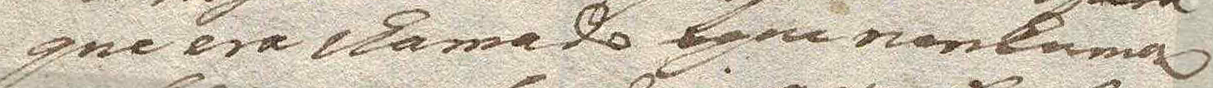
que era chamado e que nenhuma
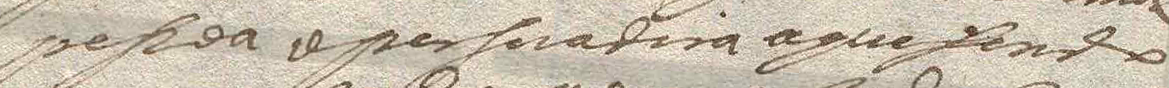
pessoa o persuadira a que sendo
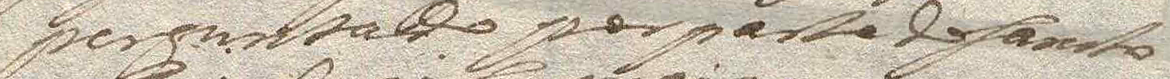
perguntado por parte do Sancto
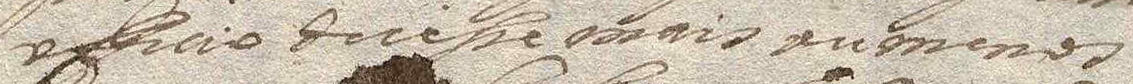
officio dicesse mais ou menos
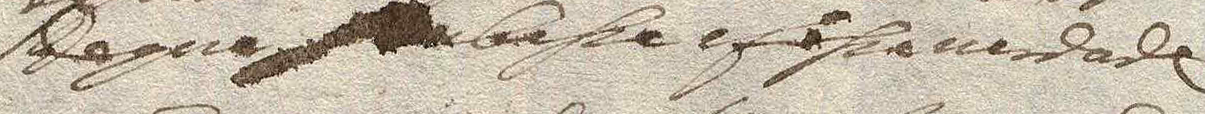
de que _ubesse e fosse uerdade
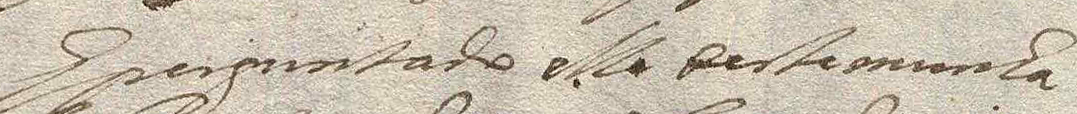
E perguntado elle testemunha
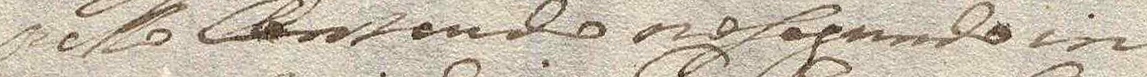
pello conteudo no segundo in
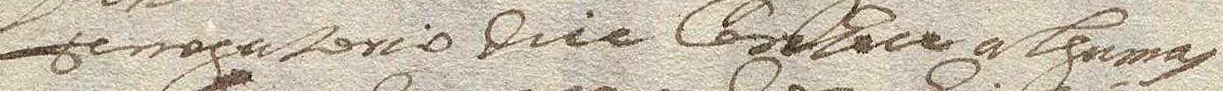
terrogatorio dice Conhece algumas
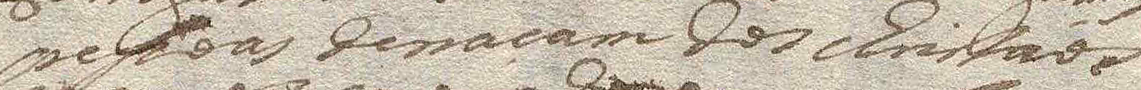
pessoas de naçam dos christaõs
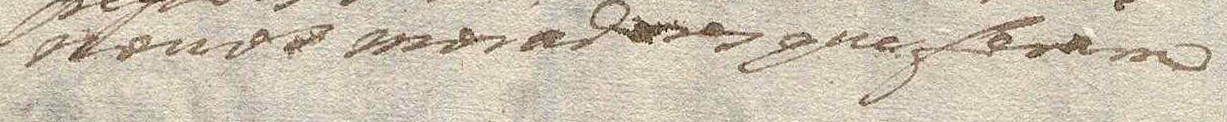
nouos moradores que foram
